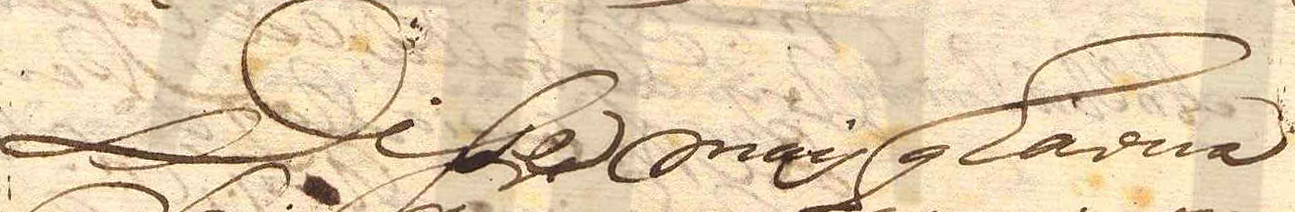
Disse mais q̄ havera
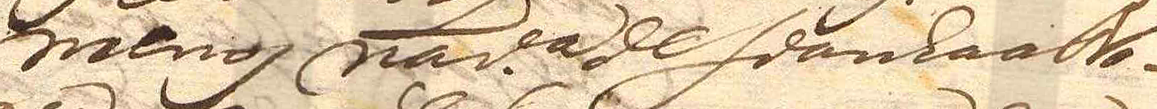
menos na v.a de Jdanha a No
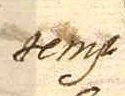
temp
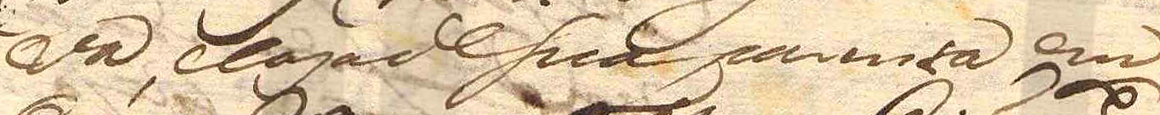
va, e caza de sua parenta em
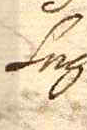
Lug
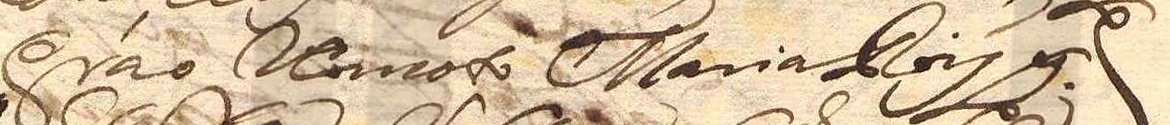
gráo Remoto Maria Rois̄ p.te
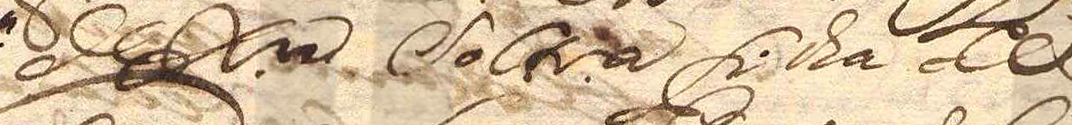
de X. n Soltr.a filha de
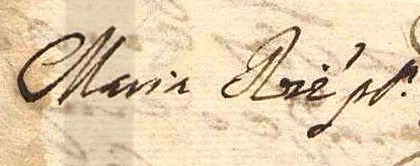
Maria Roiz̄ p.te
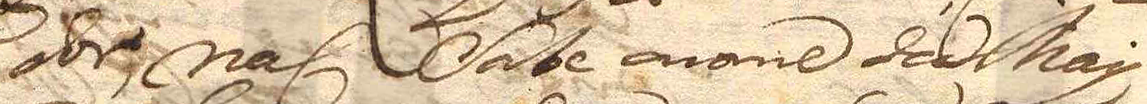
dor, naꝭ Sabe o nome da May
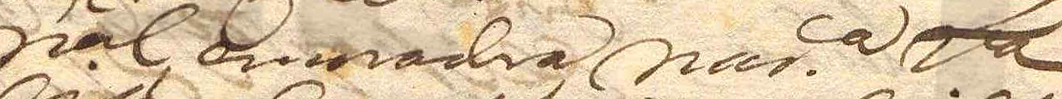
n.al, e moradora na d.a v.a
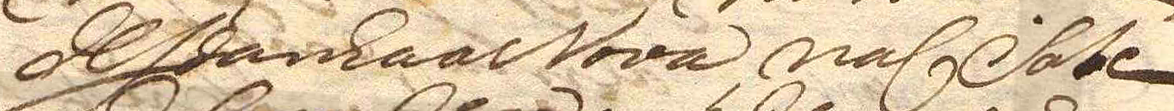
de Jdanha a Nova, naꝭ sabe
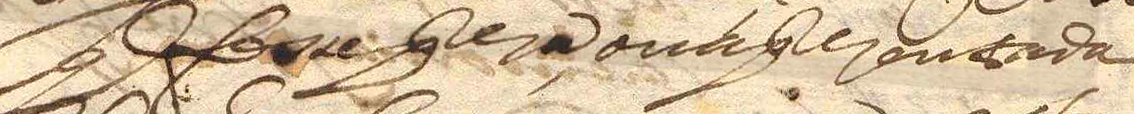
q̄ fosse pReza, ou apRezentada
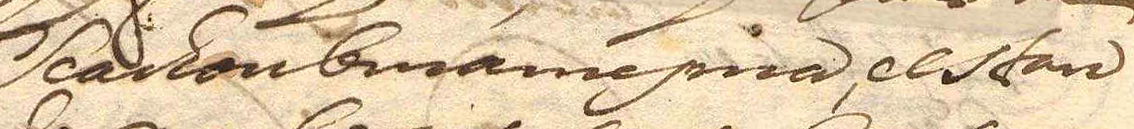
Se achou com a mesma, e estan
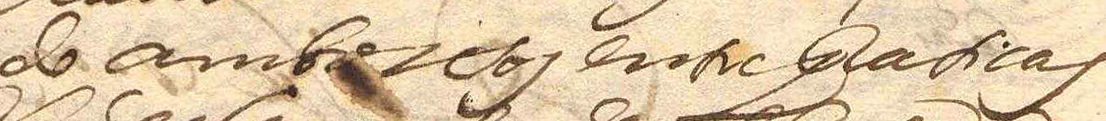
do ambos sós entre pRaticas
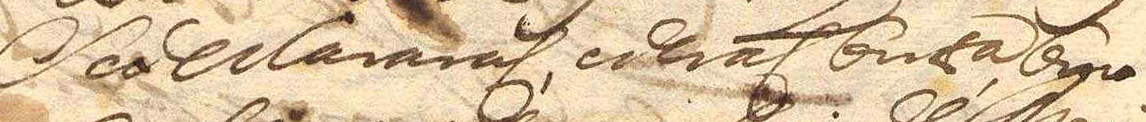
Se declararaꝭ, e deraꝭ Conta, Como
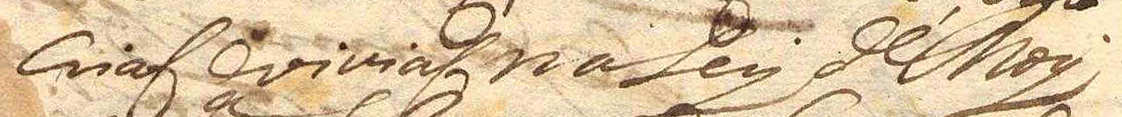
criaꝭ e viviaꝭ na Ley de Moy
